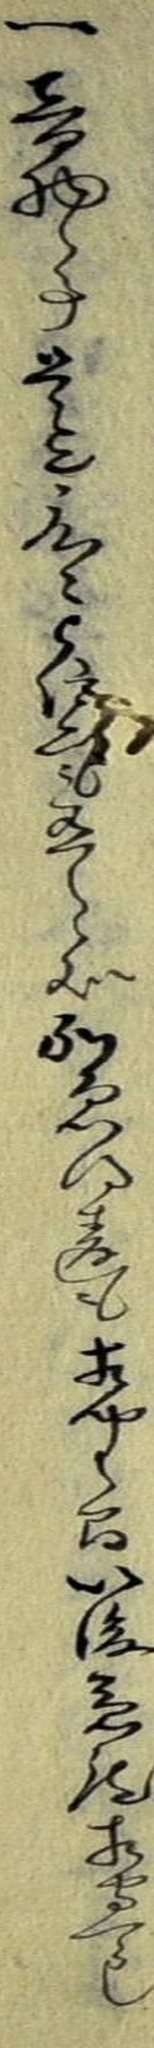一音物之事是迄度々被仰出も有之候処別而心得違も相聞候間以後急度相守可申候

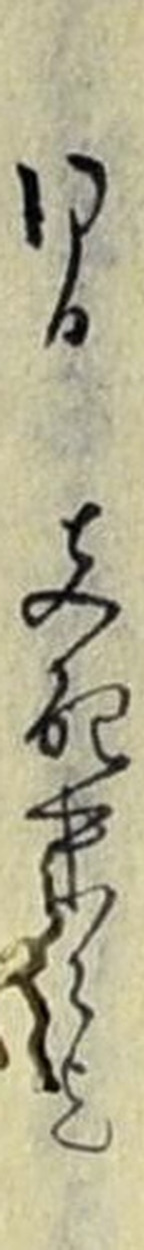同日支配末々迄
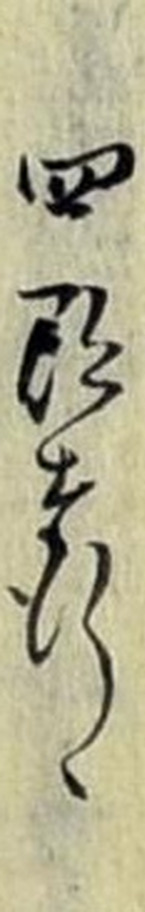四郡奉行へ
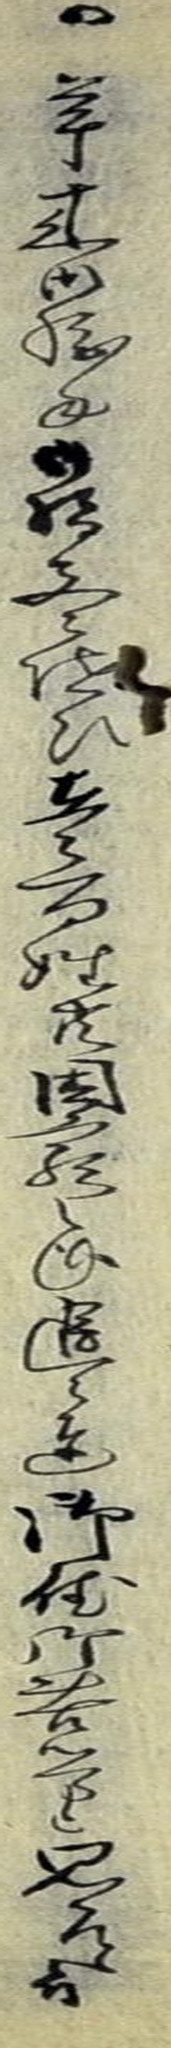〇年来御勝手御指支に随ひ在々百姓共困窮之趣追々達御聴御苦労被思召候に付
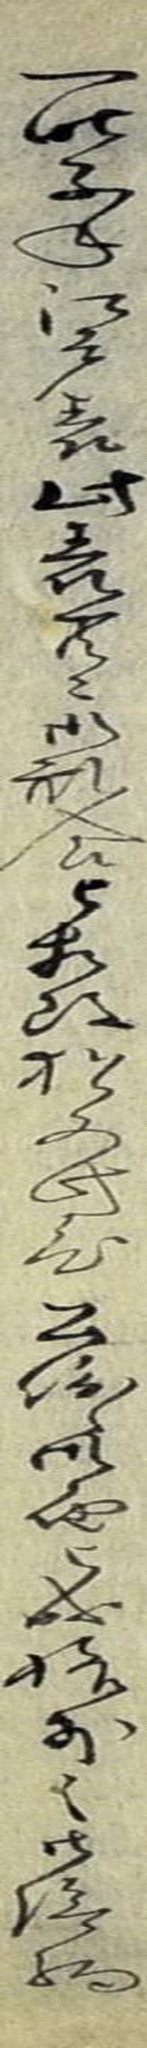一昨子年江戸表此表共に御形合被相改猶又此度公儀へ御届被成格外之御倹約
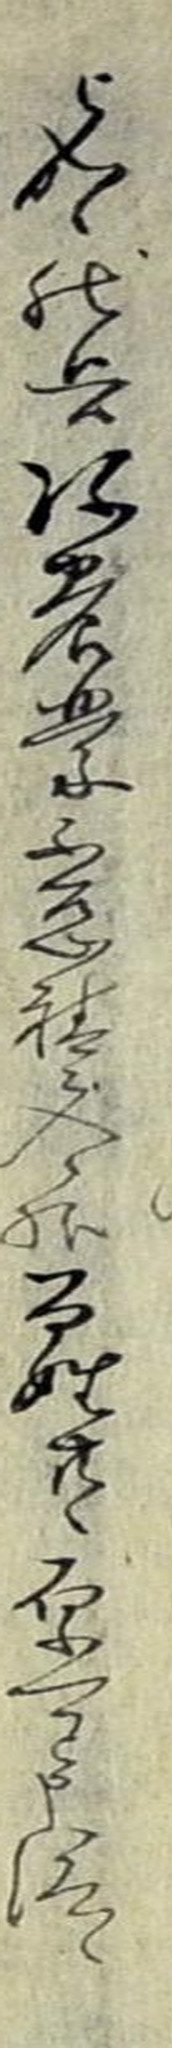被成候然上は弥農業不怠精に入候様百姓共へ厚可被申渡候
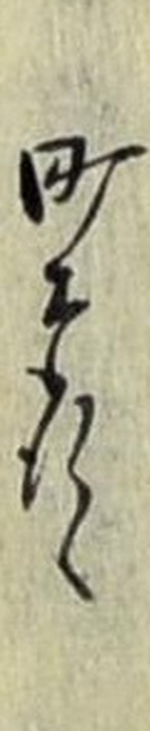町奉行へ
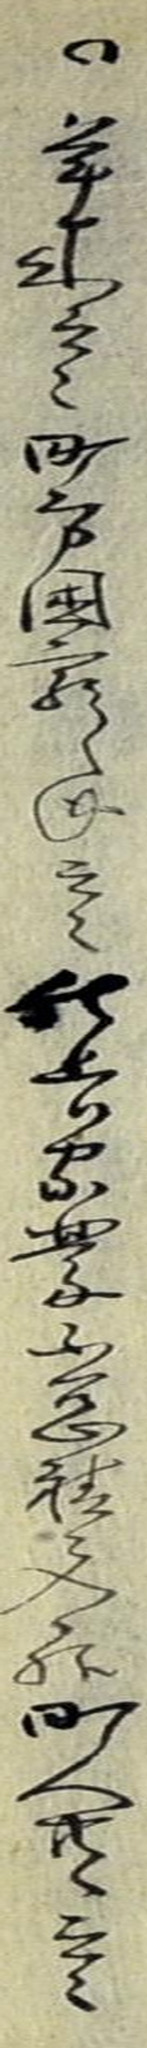〇年来云々町方困窮之趣云々然上は家業不怠精に入候様町人共へ云々
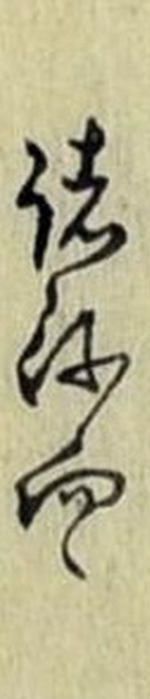諸役向へ
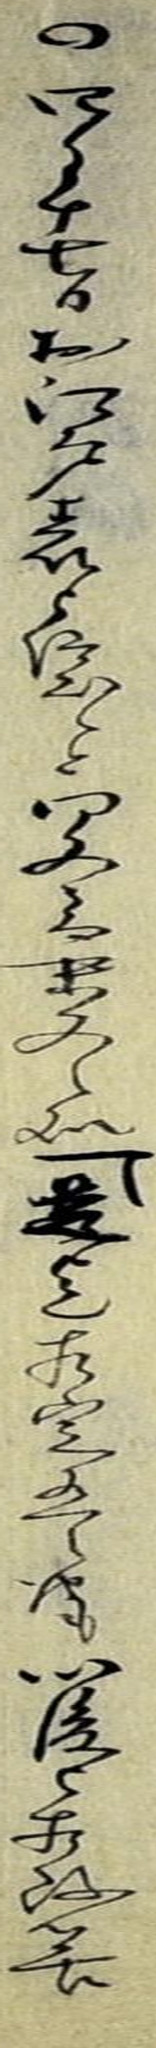〇四月十七日於江戸表被仰出候と同文に而末文之処「是迄相定有之儀も以後被相改筈
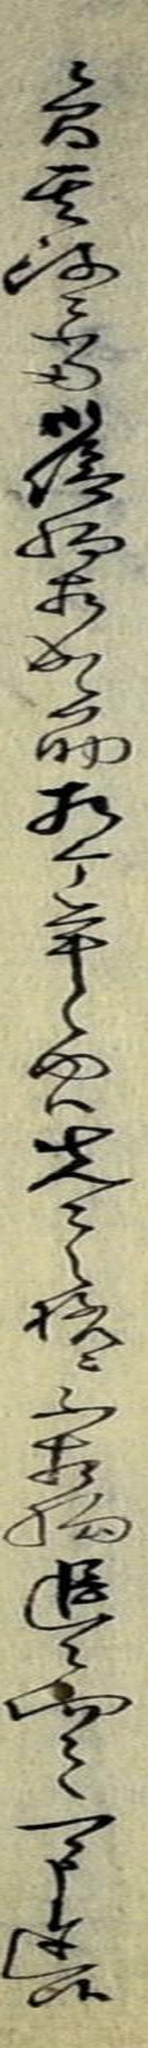候間其役に当御倹約相成筋拾ヶ年之内は先々之格に不相拘追々向々へ可申達候
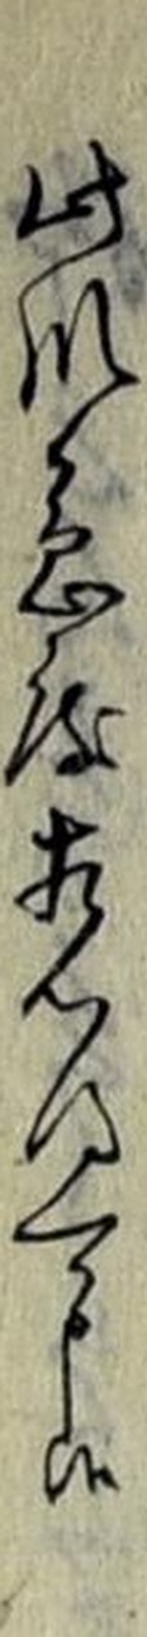此段急度相心得可申候
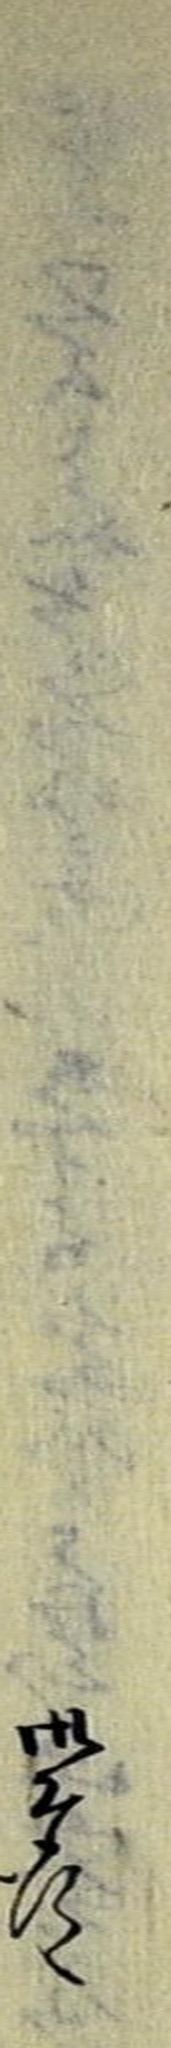御奉行へ
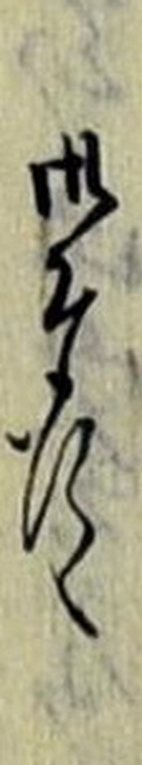御奉行へ
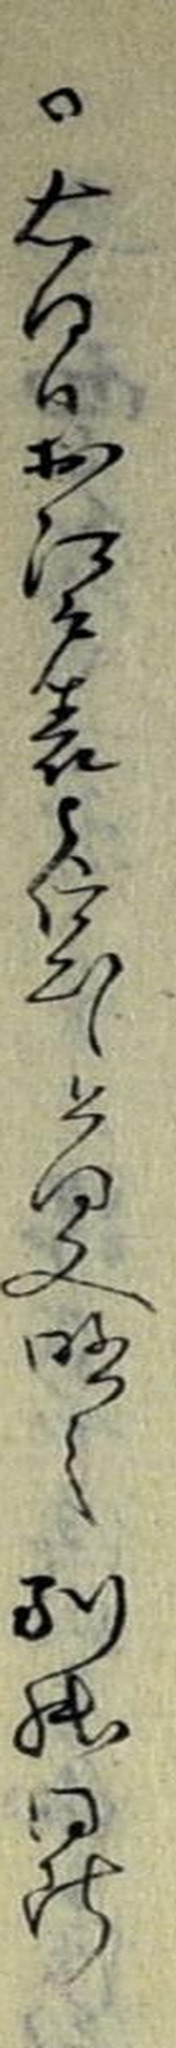〇右同日於江戸表被仰出候と同文略之別紙同断
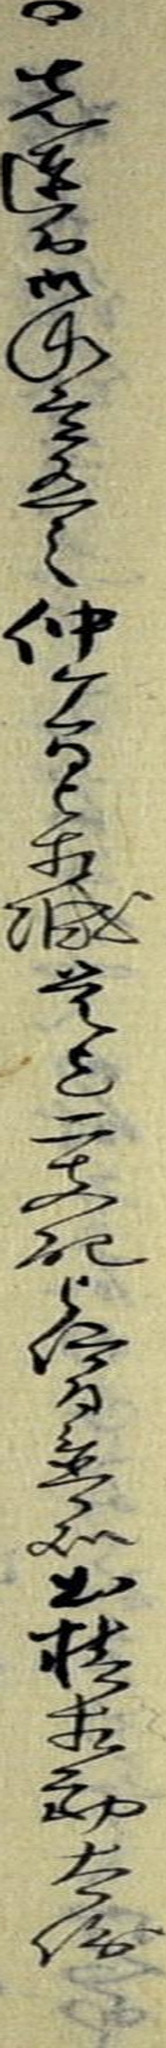〇先達而御趣意有之仲ヶ間被相減是迄二支配被仰付置候処出精相勤太儀
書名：命令之部 二
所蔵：福井県文書館 Fukui Prefectural Archives
